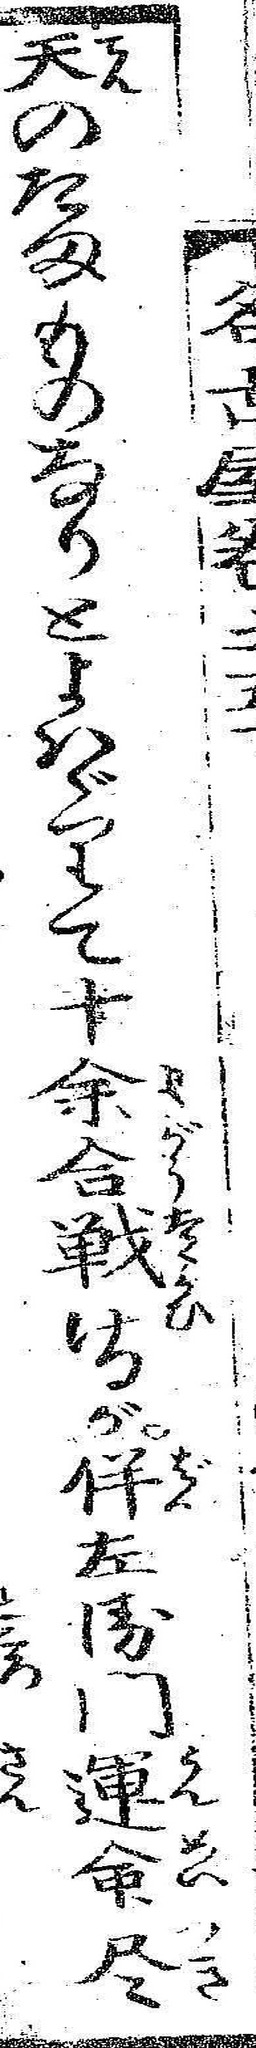天のたまものなりとよはゞりて十余合戦けるが。伴左衛門運命尽
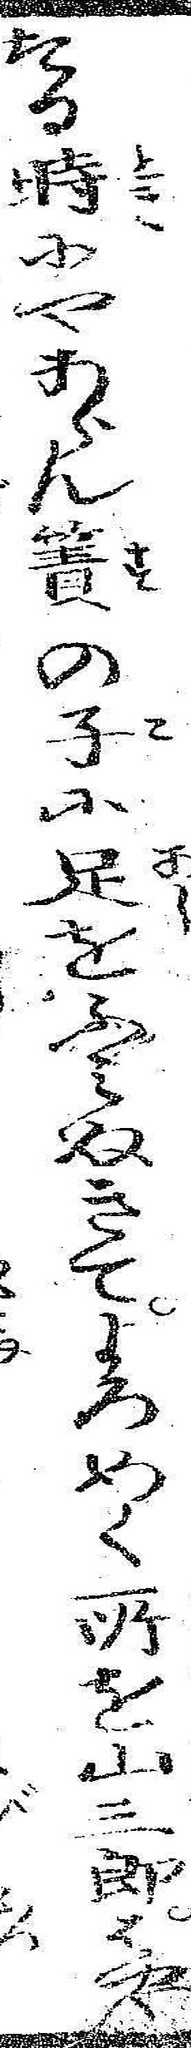たる時にやあらん簀の子に足をふみぬきて。よろめく所を山三郎。はや
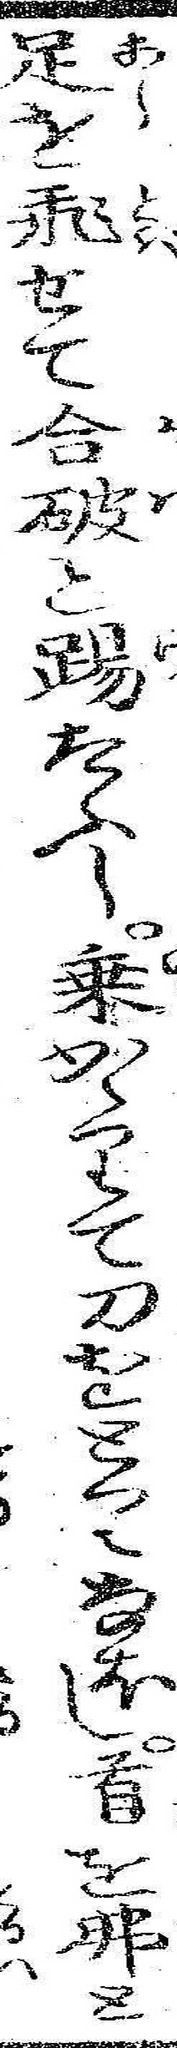足を飛せて合破と踢たふし。乗かゝりて刀をとりなほし。首を弗と
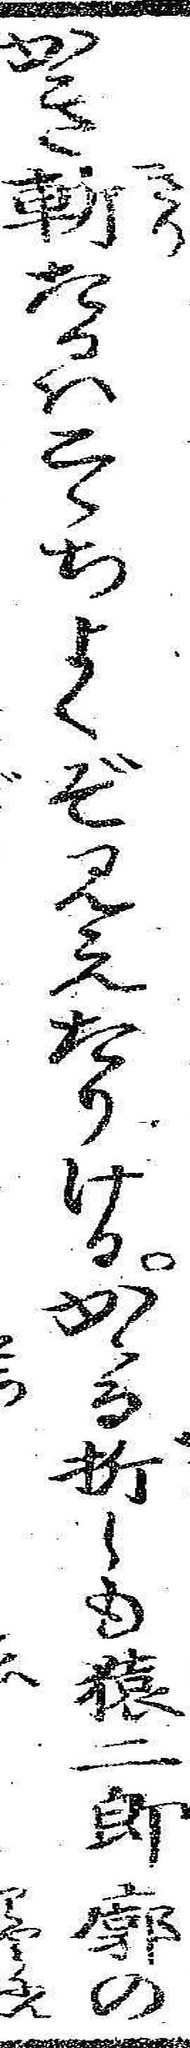かき斬たるはこゝちよくぞ見えたりける。かゝる折しも猿二郎廓の
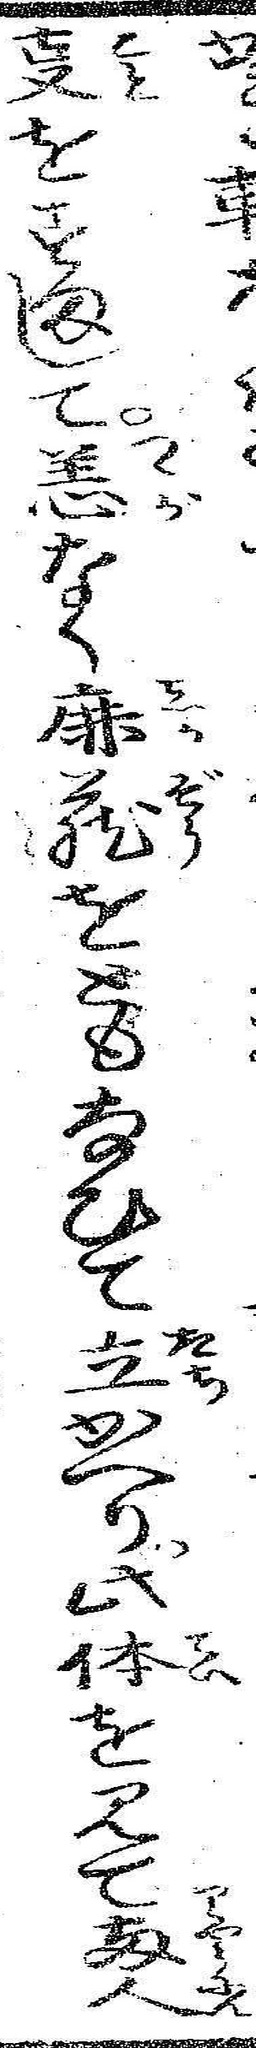事をすまして。恙なく鹿蔵をともなひて立かへり。此体を見て両人
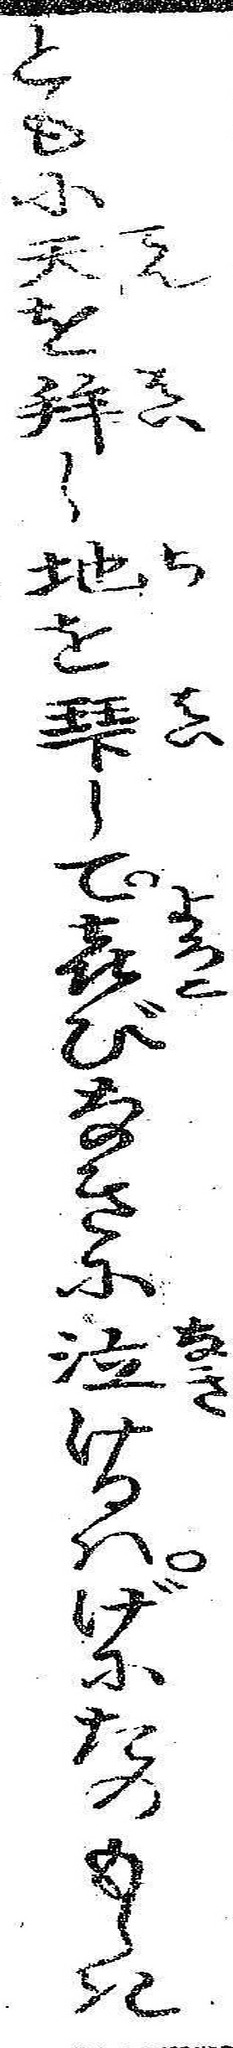ともに天を拝し地をして。㐂びなきに泣けるは。げにたのもしき
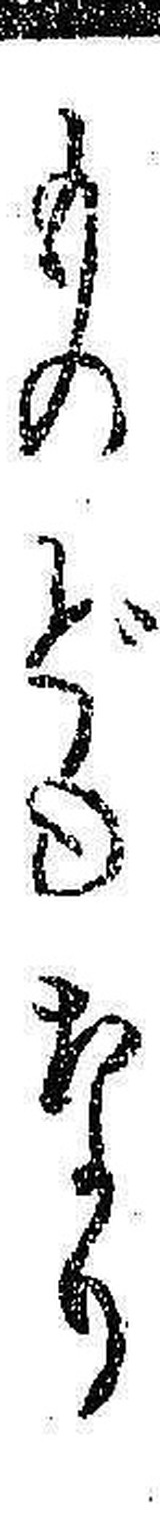ものどもなり
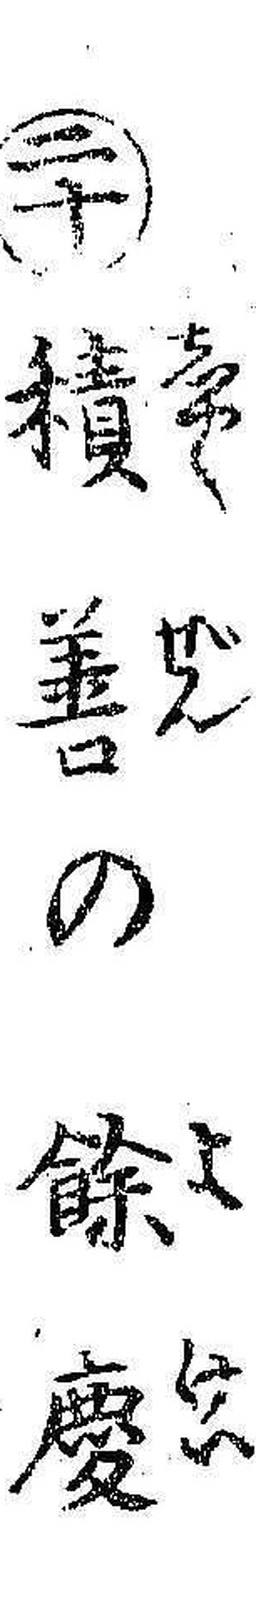二十積善の余慶
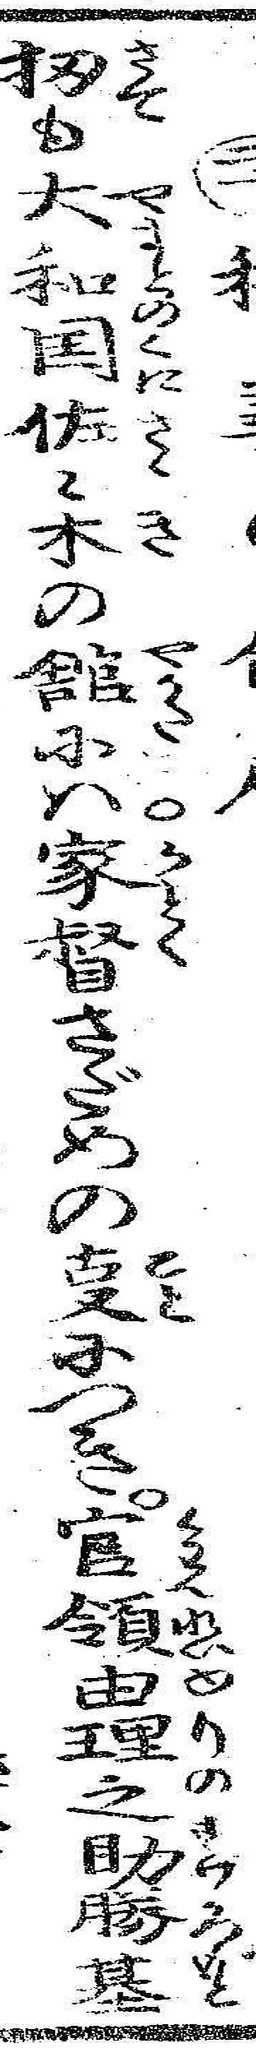扨も大和国佐々木の館には。家督さだめの事につき。官領由理之助勝基
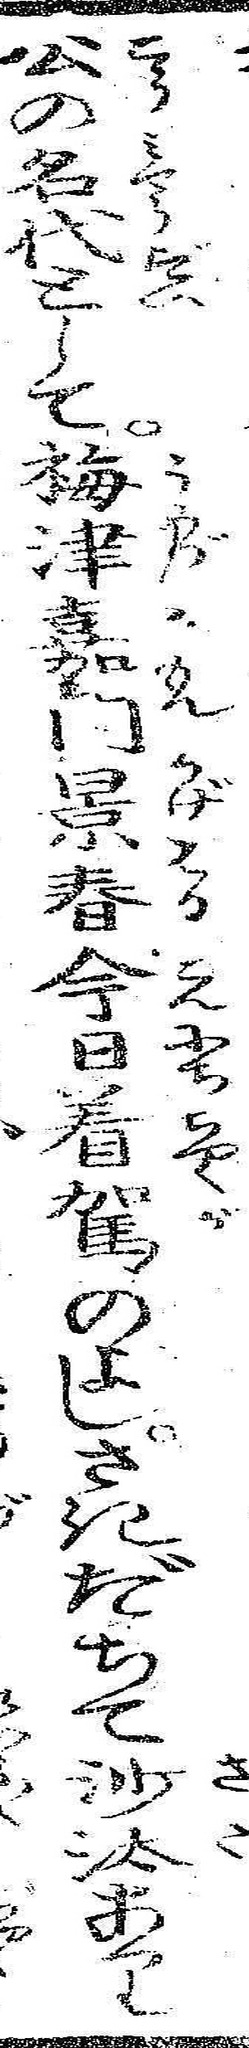公の名代として。梅津嘉門景春今日着駕のよし。さきだちて沙汰あり
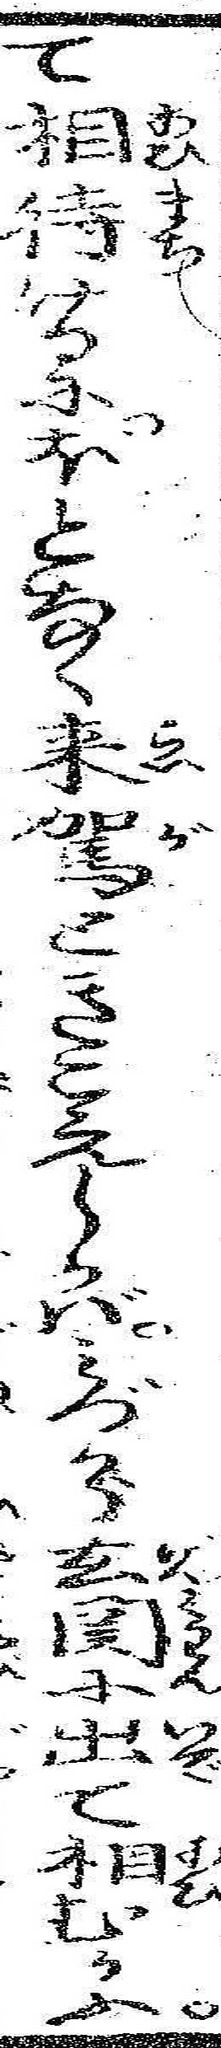て相待けるに。ほとなく来駕ときこえしかば。みづから玄関に出て相むかふ。
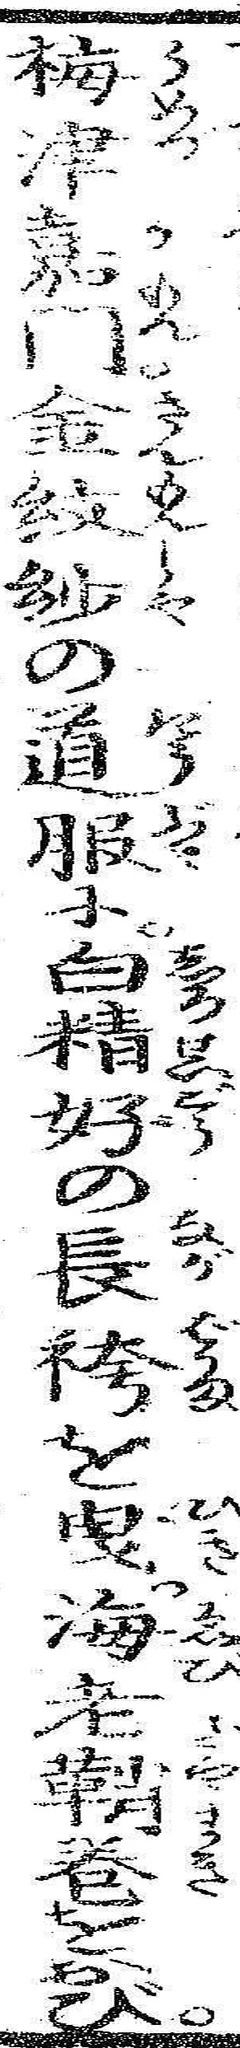梅津嘉門。金紋紗の道服に。白精好の長袴を曳。海老鞘巻をおび。
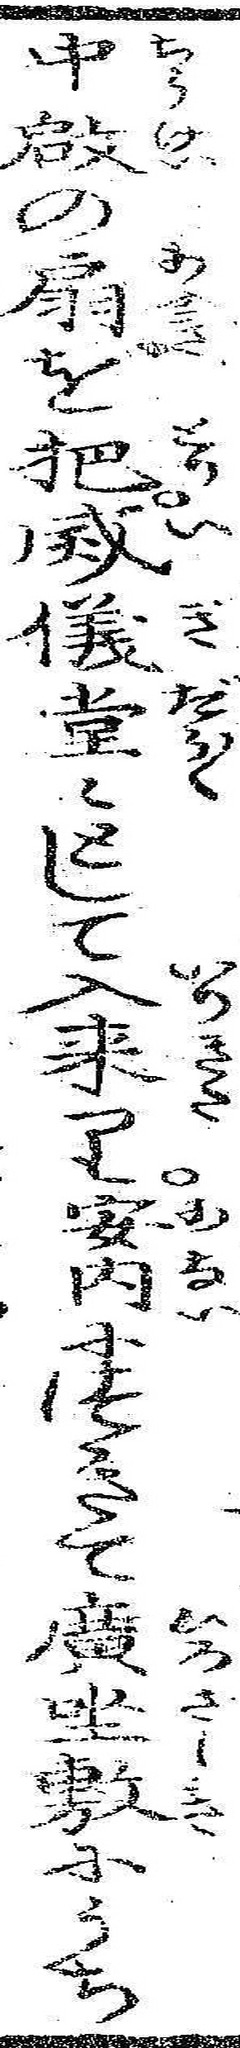中啓の扇を把。烕儀堂々として入来り。安内につきて広坐敷にうち
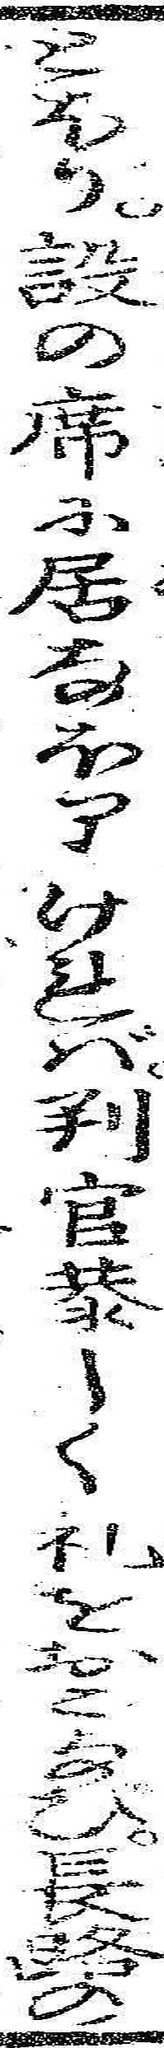とほり。設の席に居なほりければ。判官恭しく礼をおこなひ。長路の
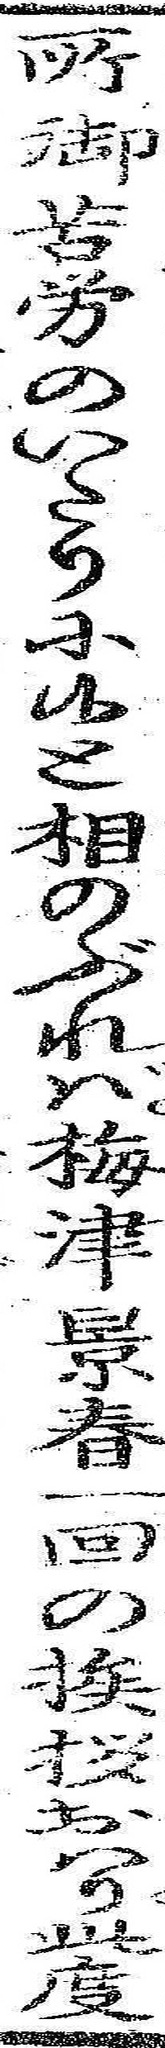所御苦労のいたりに候と相のぶれば。梅津景春一回の挨拶おはり。此度
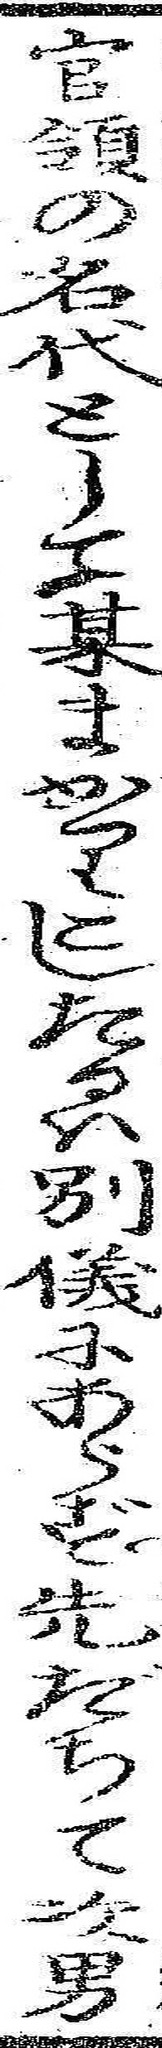官領の名代として某まかりこしたるは別儀にあらず。先だちて次男
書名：昔話稲妻表紙
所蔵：国文学研究資料館
